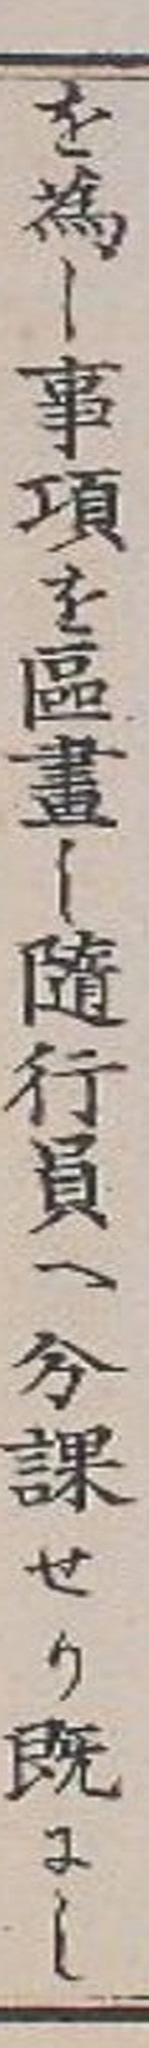を為し事項を品書し随行員へ分課せり既にし
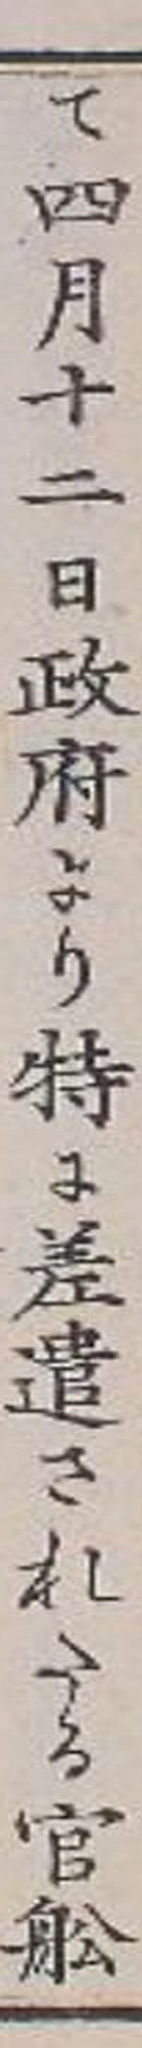て四月十二日政府より特に差遣されたる官船
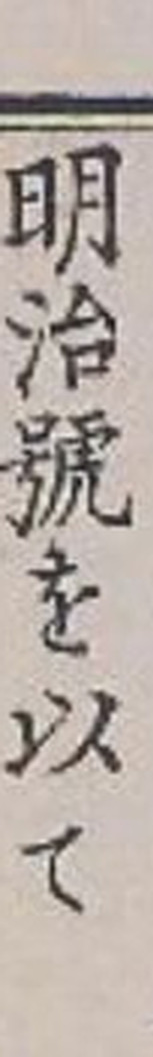明治号を以て
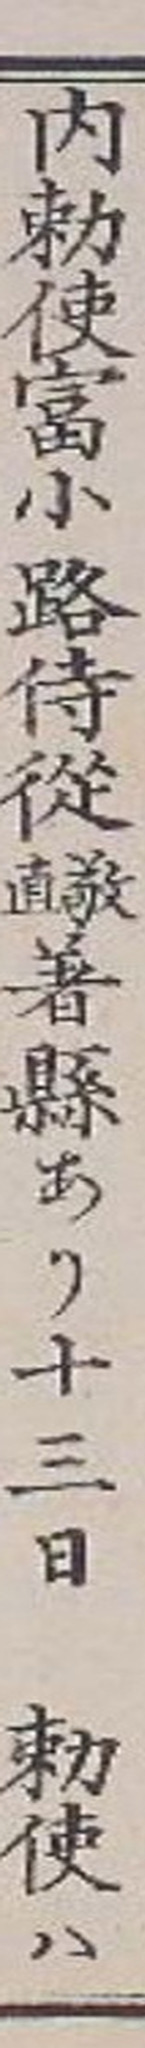内勅使富小路侍従敬直着県あり十三日勅使は
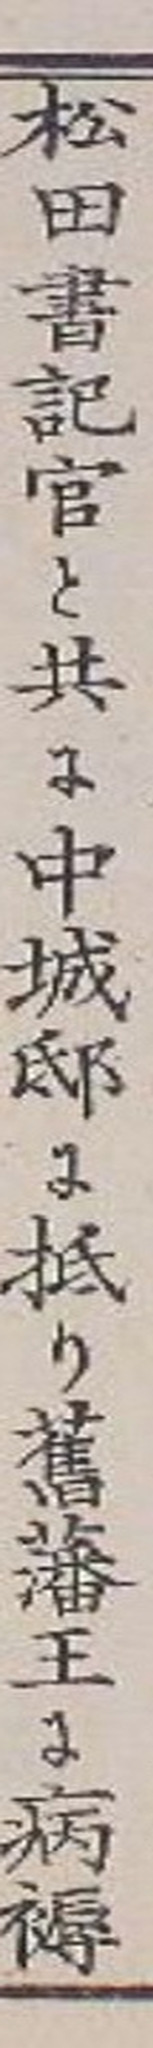松田書記官と共に中城邸に抵り旧藩王に病褥
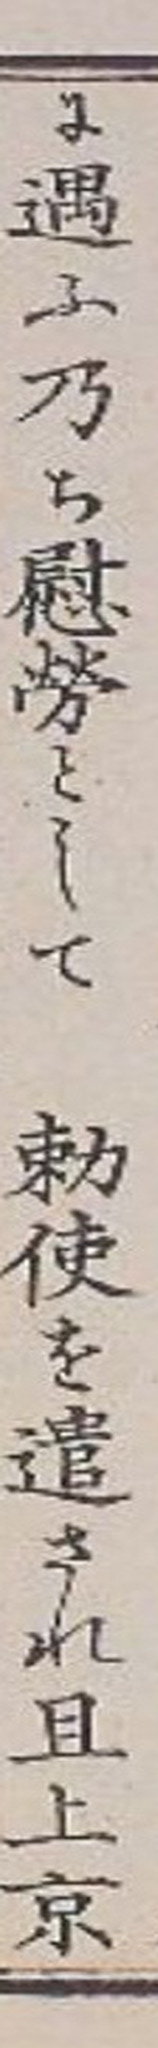に遇ふ乃ち慰労として勅使を遣され且上京
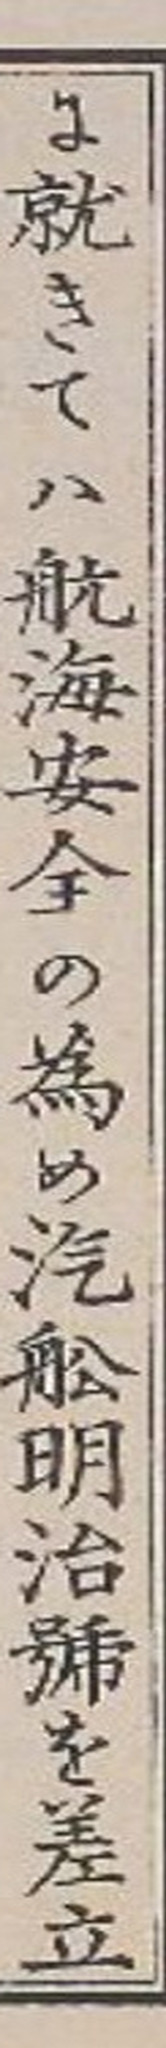に就きては航海安全の為め汽船明治号を差立
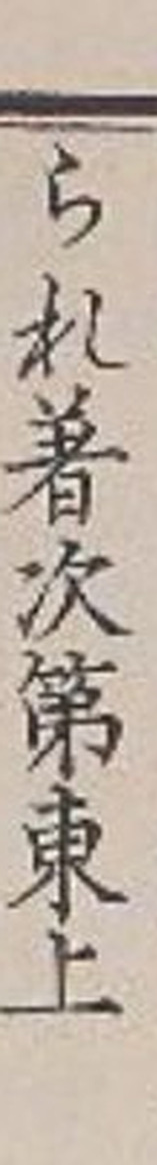られ着次第東上
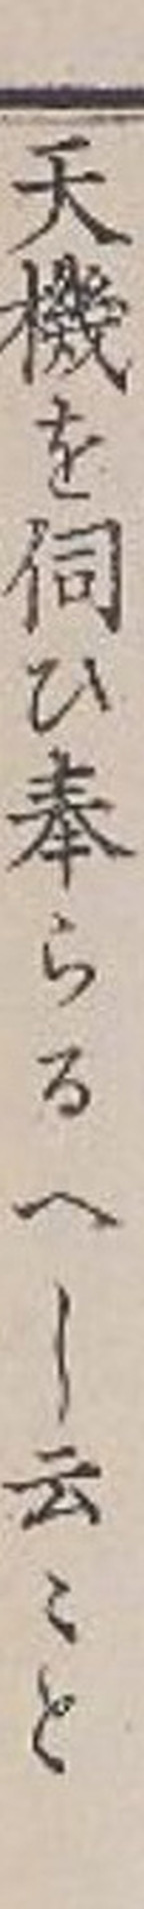天機を伺ひ奉らるへし云々と
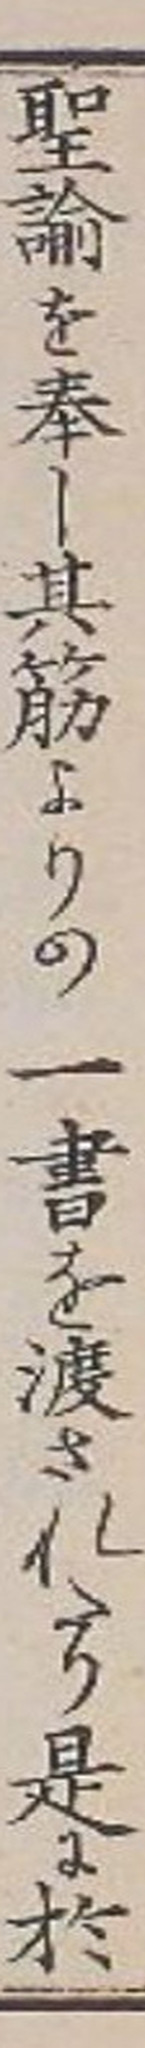聖諭を奉し其筋よりの一書を渡されたり是に於
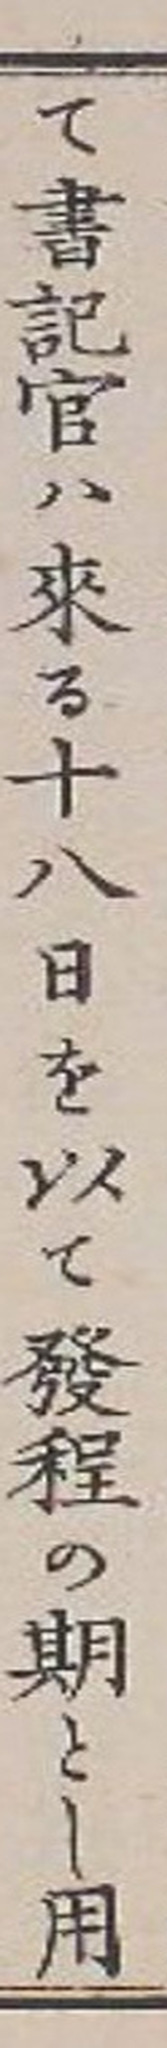て書記官は来る十八日を以て発程の期とし用
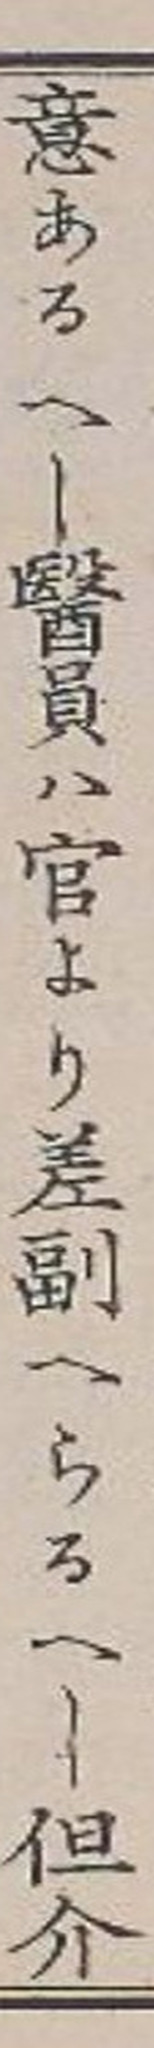意あるへし医員は官より差副へらるへし但介
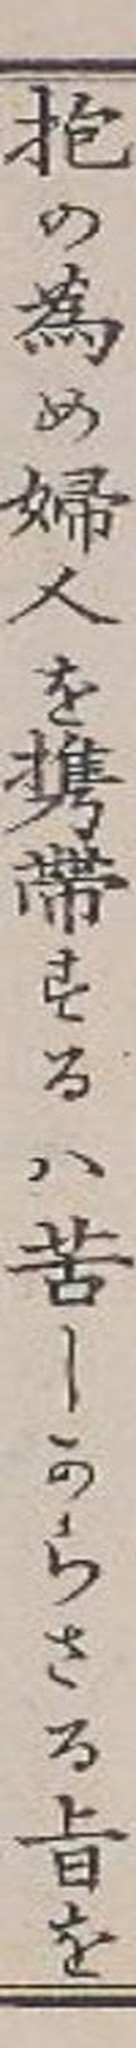抱の為め婦人を携帯するは苦しからさる旨を
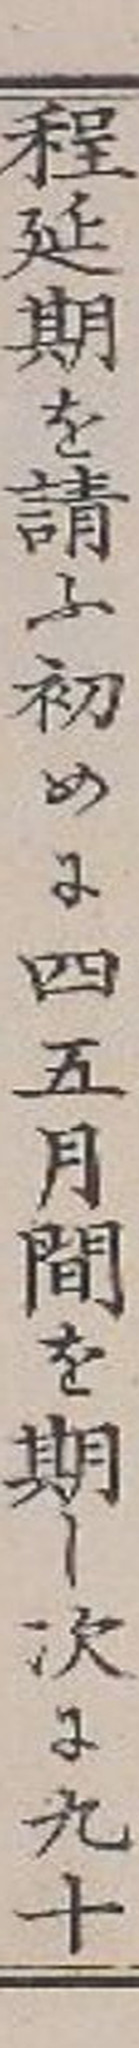程延期を請ふ初めに四五月間を期し次に九十
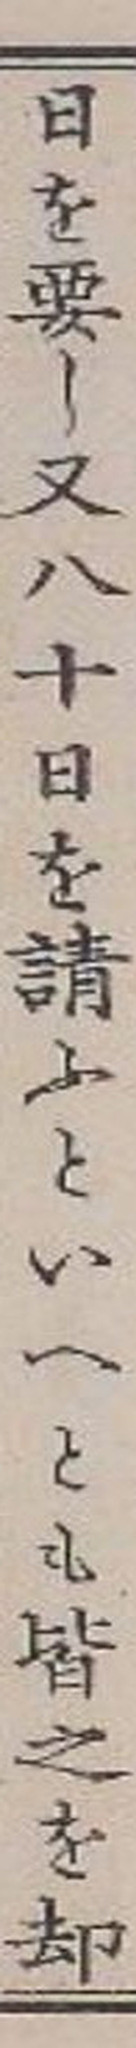日を要し又八十日を請ふといへとも皆之を却

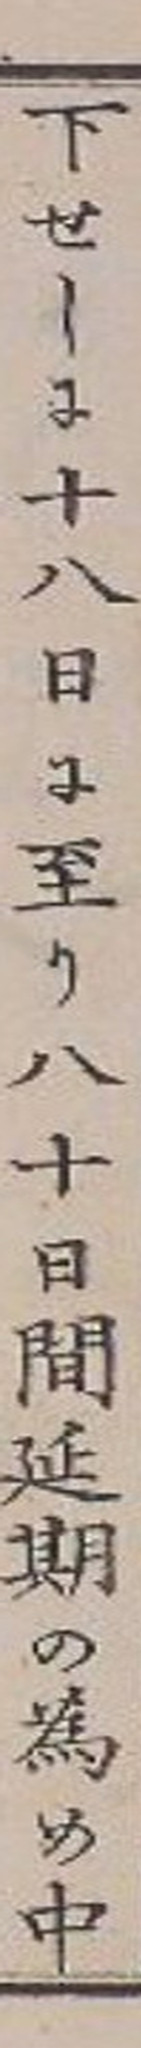下せしに十八日に至り八十日間延期の為め中
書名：南島紀事 下
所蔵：University of the Ryukyus Library
